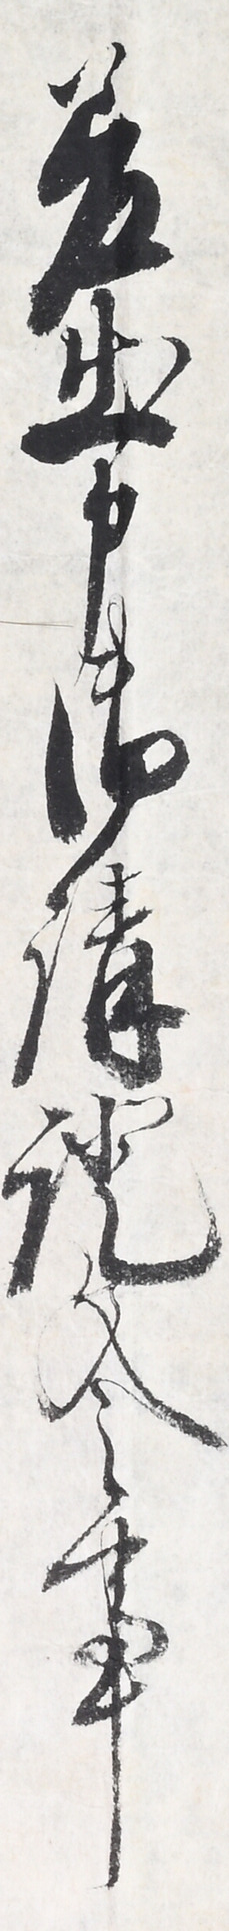差出申御請証文之事
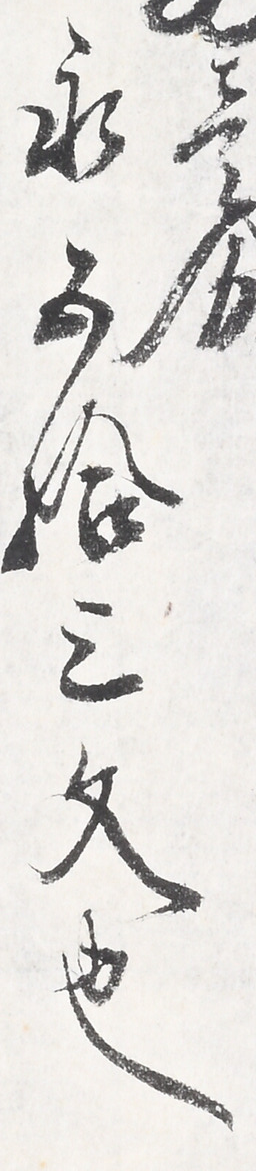永五拾三文也
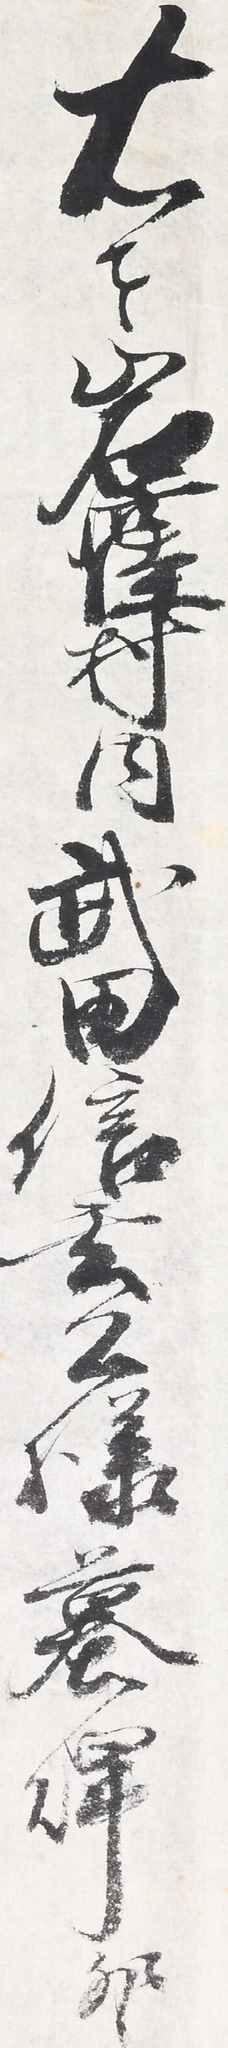右者岩窪村内武田信玄公様墓碑外
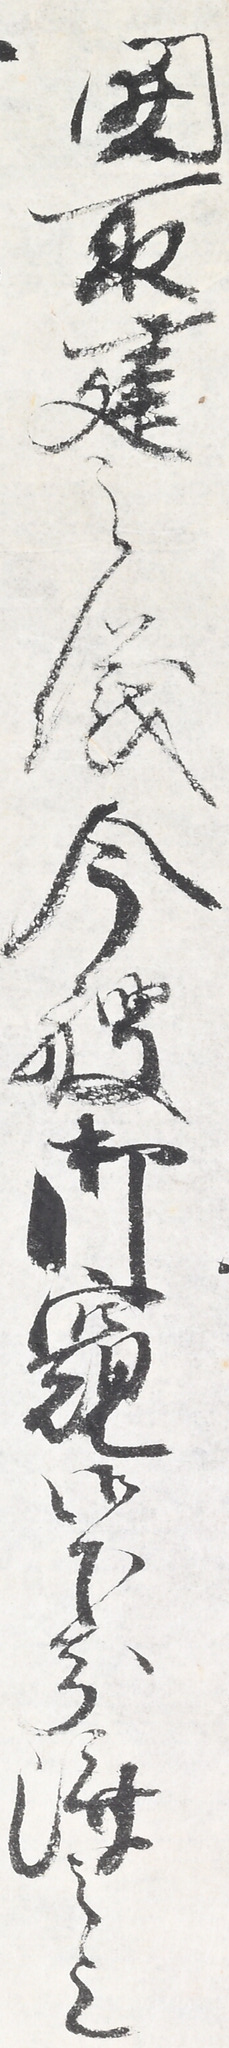囲取建之儀今般御窺御下知済之上
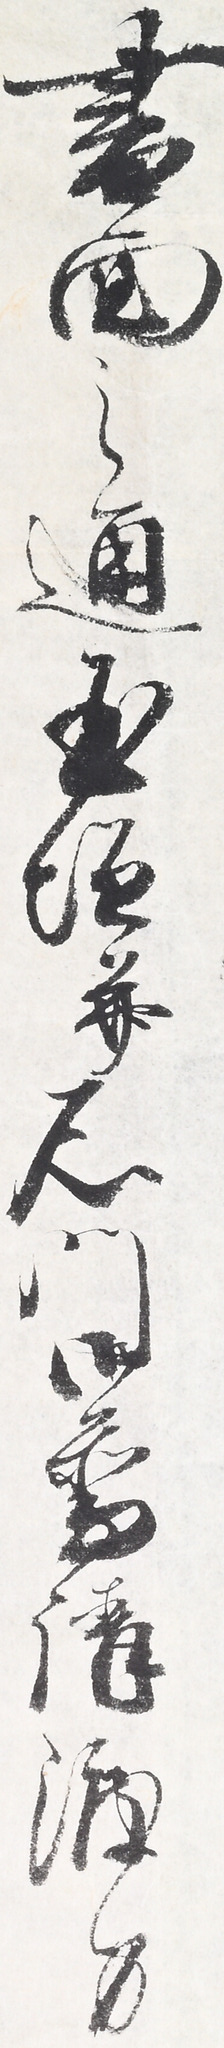書面之通玉垣并石門御普請渡方
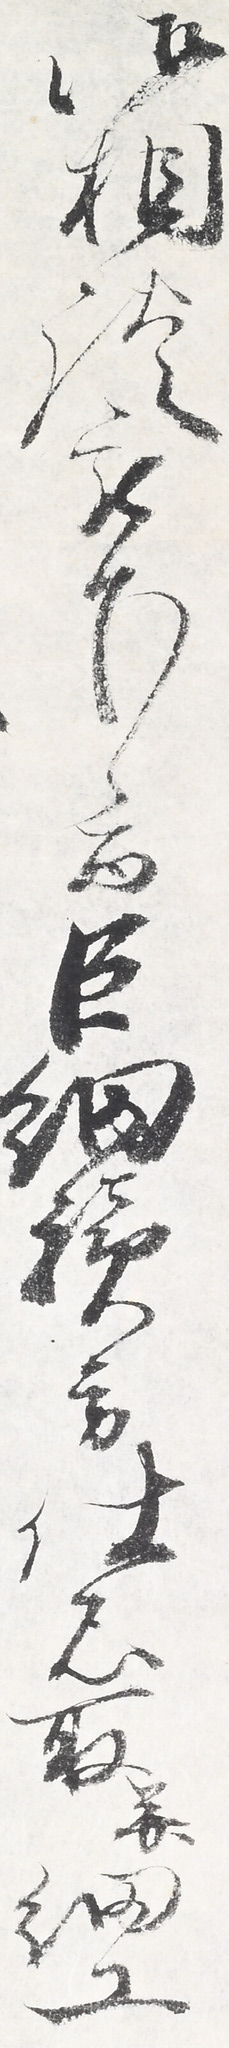御相談被下候而巨細積方仕石取并細工
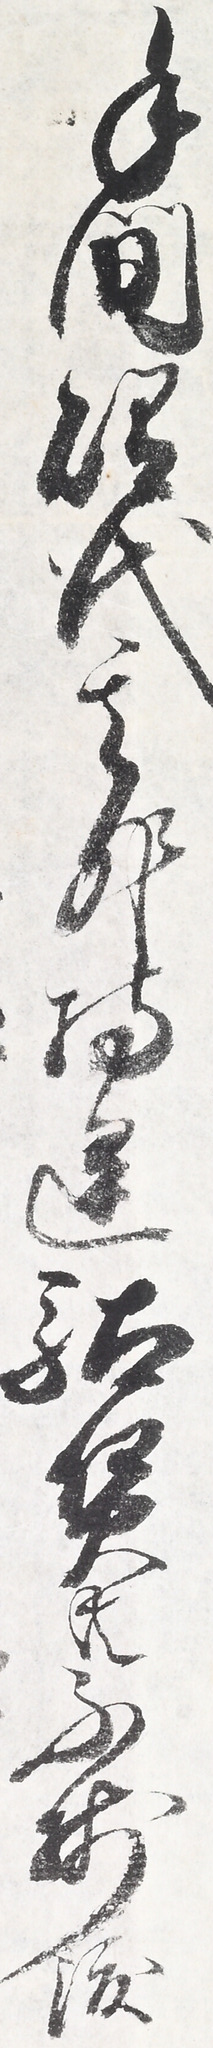手間賄代其外持速駄賃共不残渡
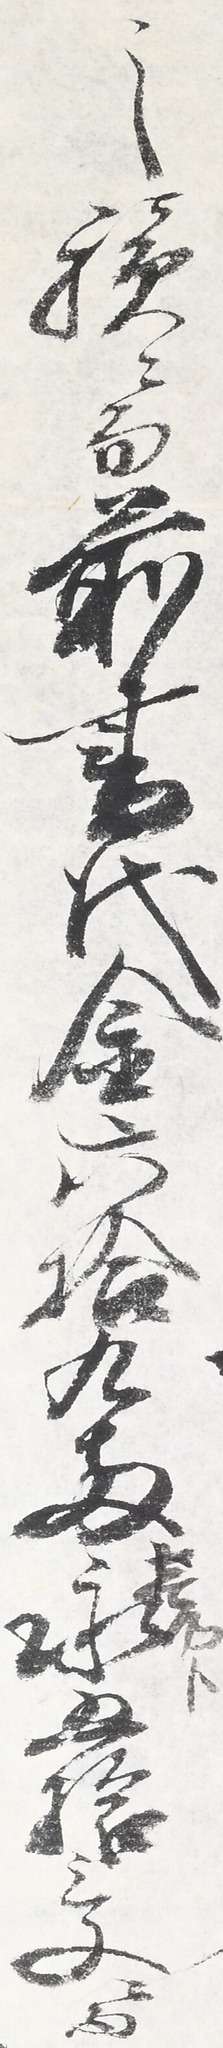之積ニ而前書代金六拾九両参分永五拾三文ニ而
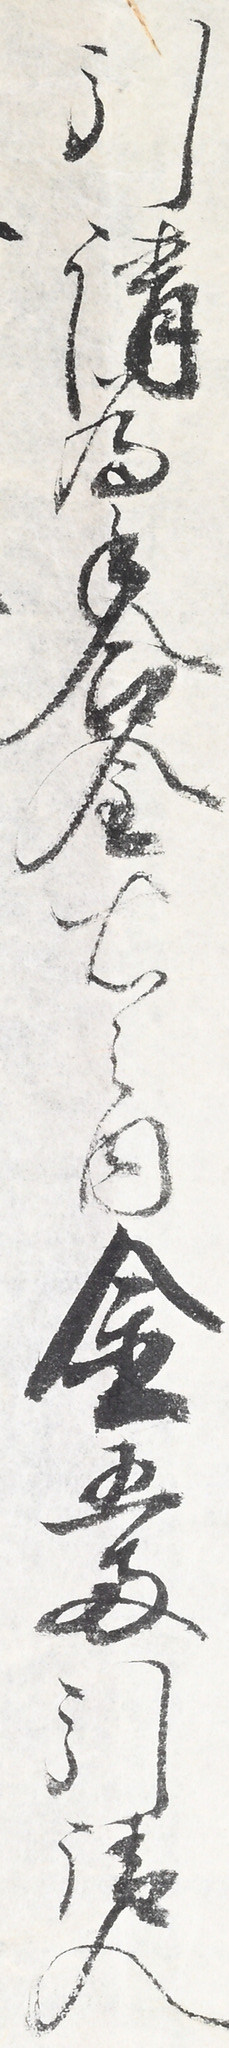引請為手合金右之内金五両引請人
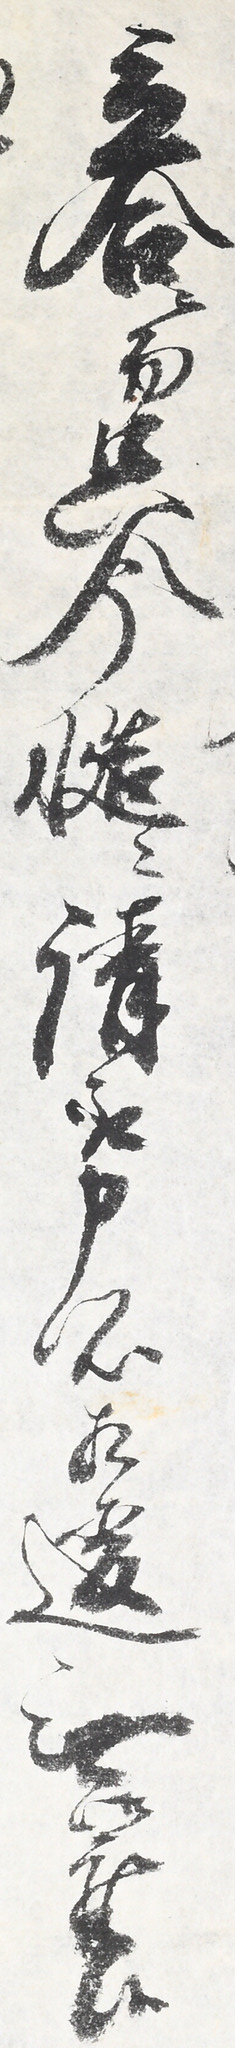立合ニ而只今慥ニ請取申所相違無御座候
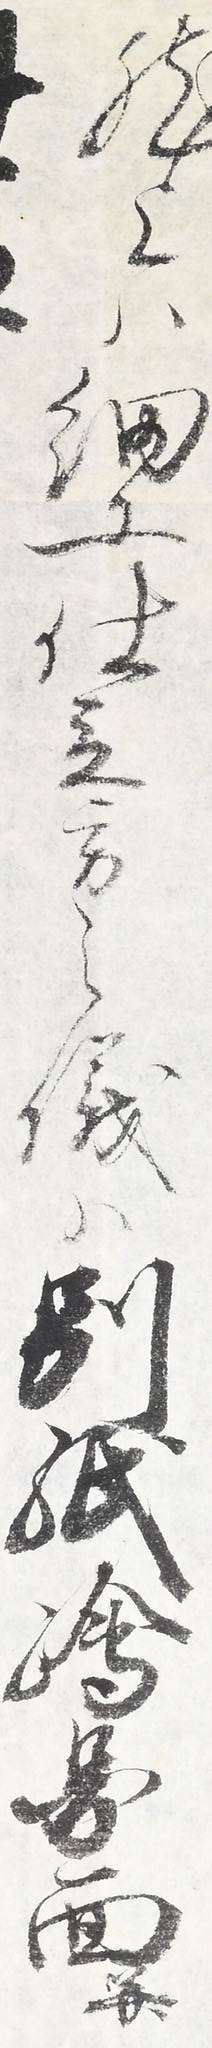然上ハ細工仕立方之儀ハ別紙絵図面并
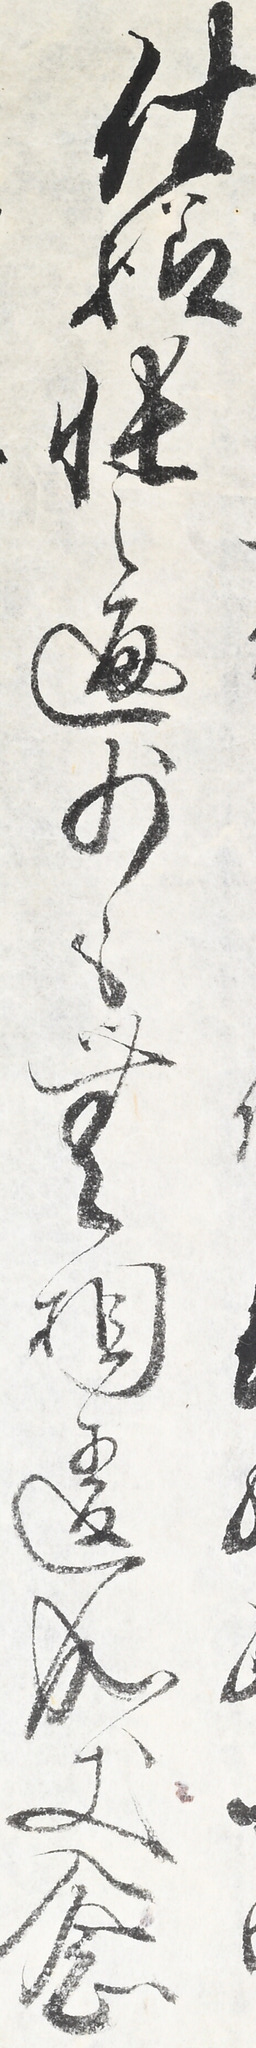仕様帳之通少も無相違成丈入念
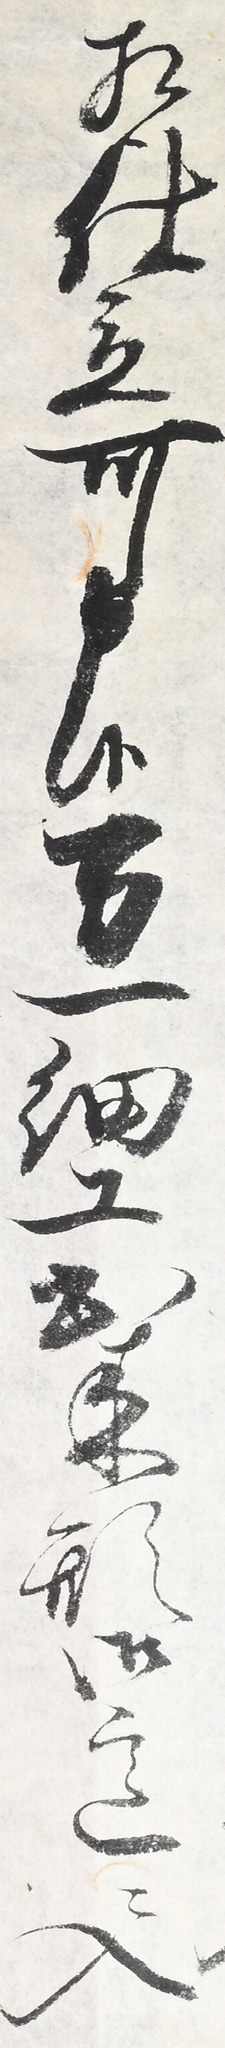相仕立可申候万一細工出来形御意ニ入
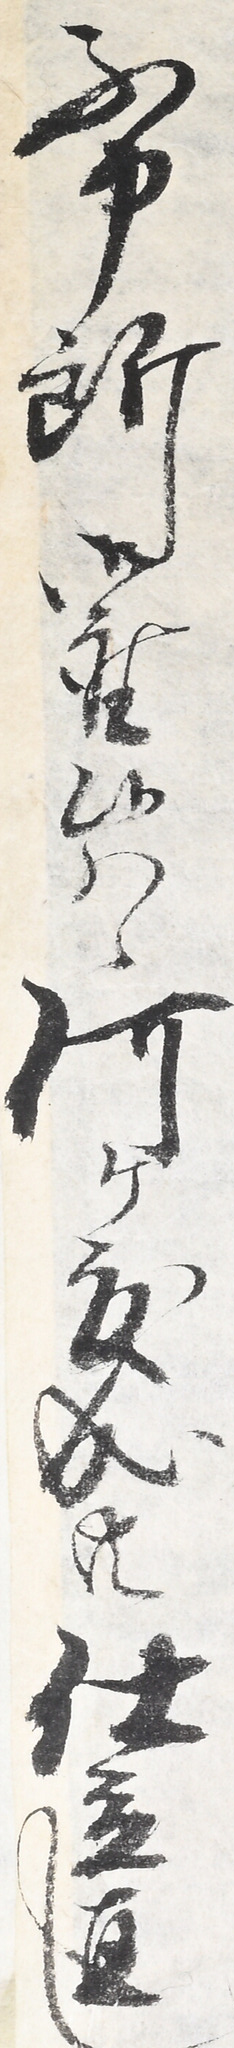不申所御座候ハヽ何ヶ度成共仕立直し
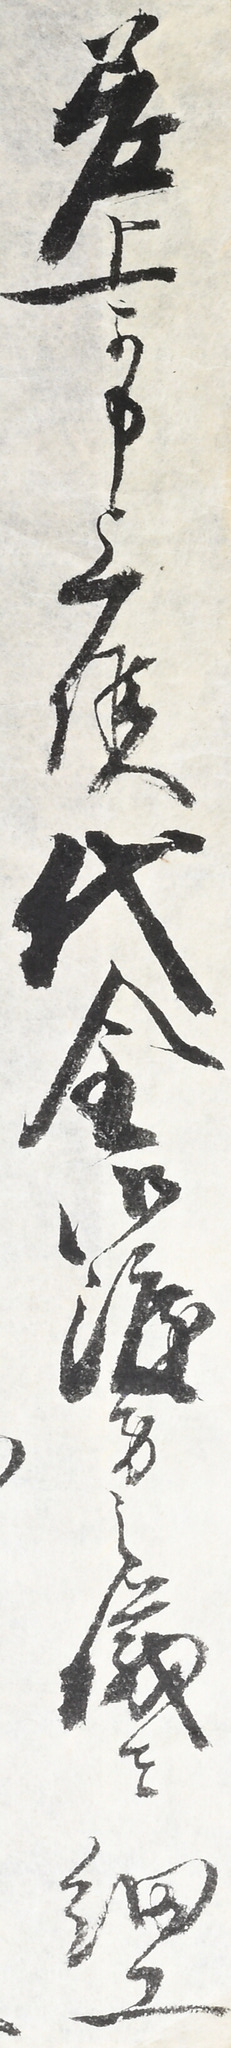差上可申上候代金御渡方之儀は細工
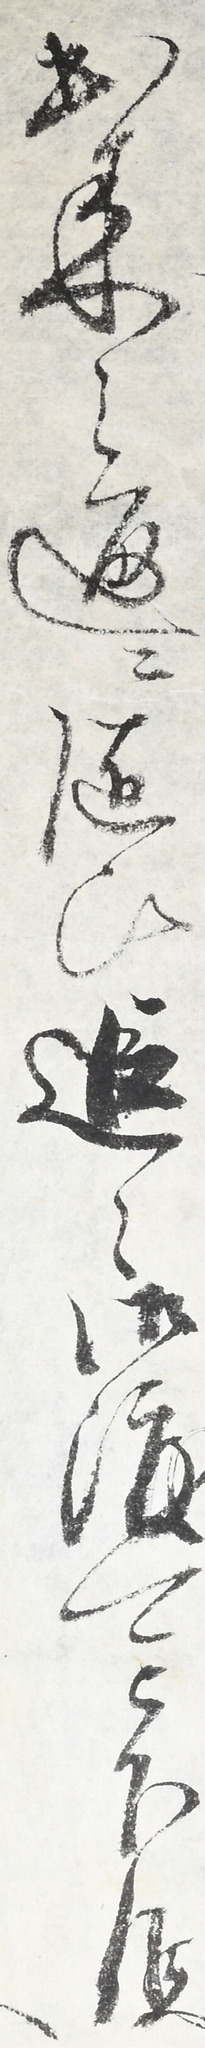出来之通ニ随ひ追々御渡可被下候
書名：差出申御請證文之事
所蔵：伊那市立高遠町図書館・合同会社AMANE
